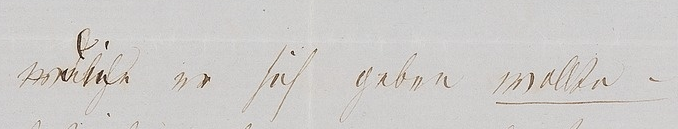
welche er sich geben wollte –
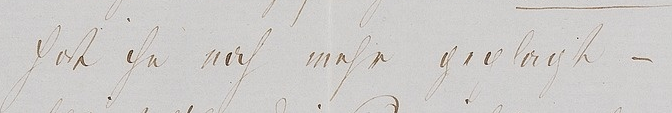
hat ihn noch mehr geplagt –
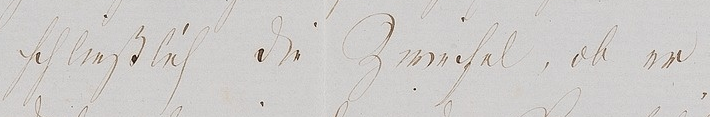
schließlich die Zweifel, ob er
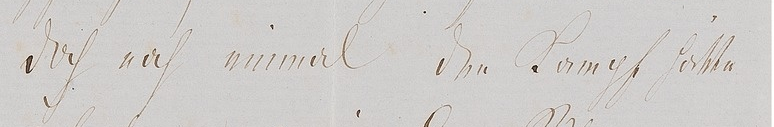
doch noch einmal den Kampf hätte
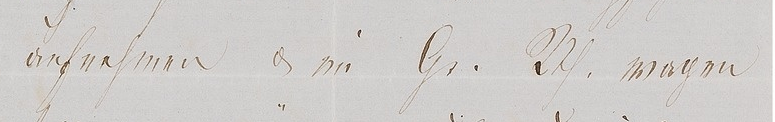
aufnehmen & im Gr. Rth. wagen
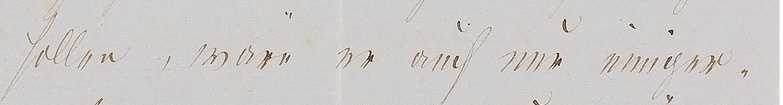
sollen, wäre er auch nur einiger-
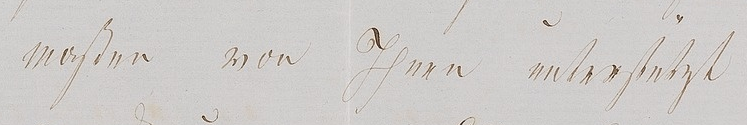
maßen von Ihnen unterstützt
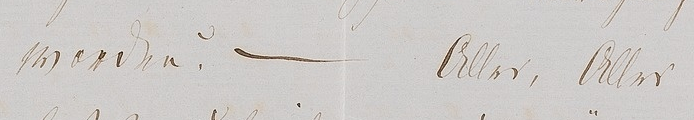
worden. – Alles, Alles
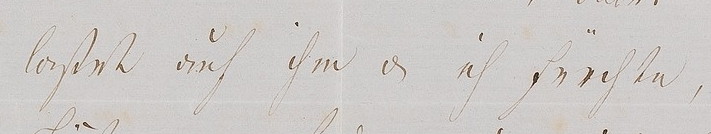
lastete auf ihm & ich fürchte,
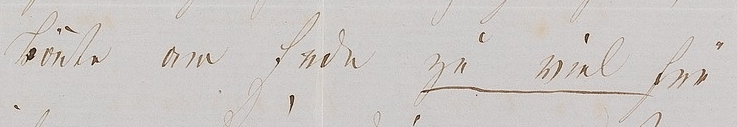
könnte am Ende zu viel für
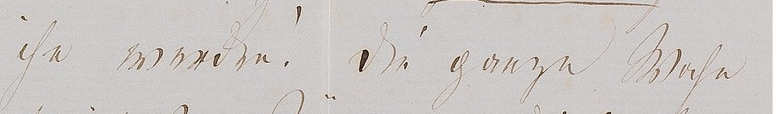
ihn werden! Die ganze Woche
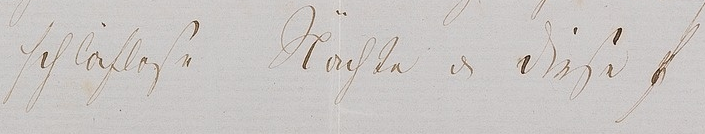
schlaflose Nächte & diese
